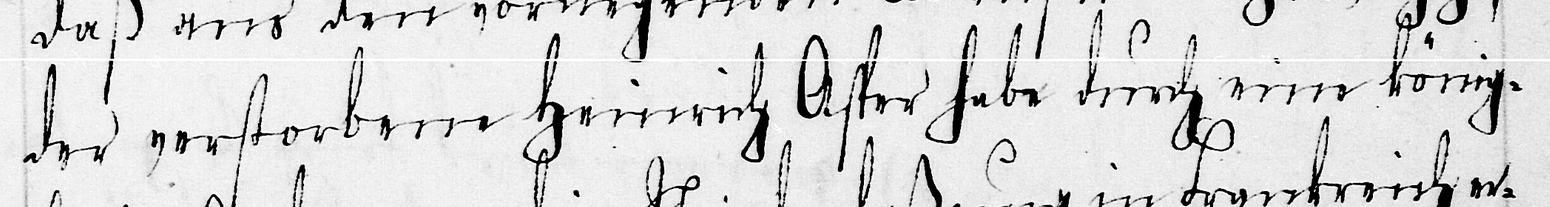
der verstorbene Heinrich Asper habe durch eine könig¬
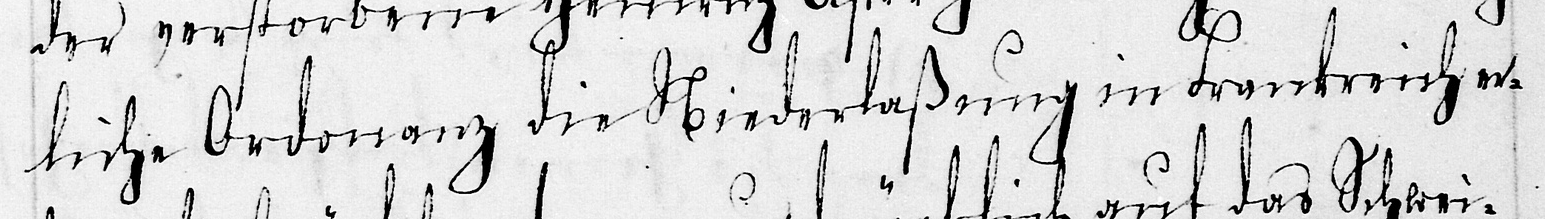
liche Ordonanz die Niederlaßung in Frankreich er¬
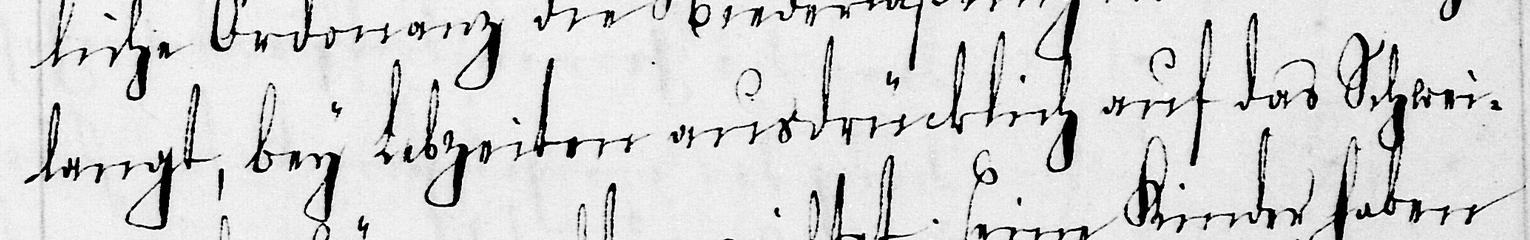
langt, bey Lebzeiten ausdrücklich auf das Schwei¬
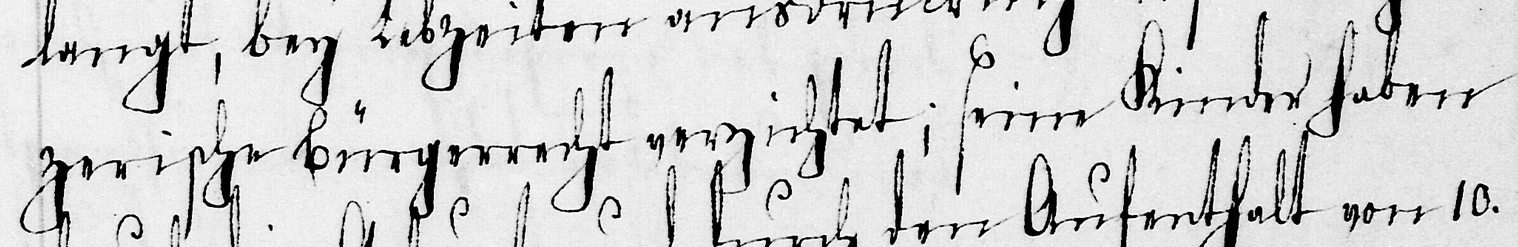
zerische Bürgerrecht verzichtet; seine Kinder haben
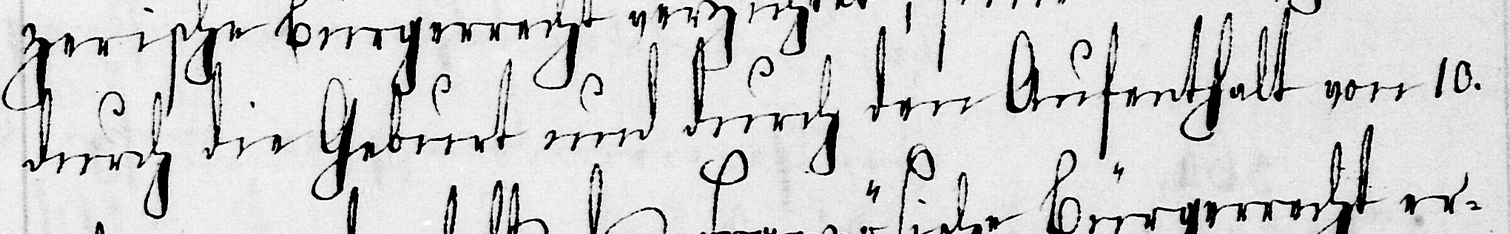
durch die Geburt und durch den Aufenthalt von 10.
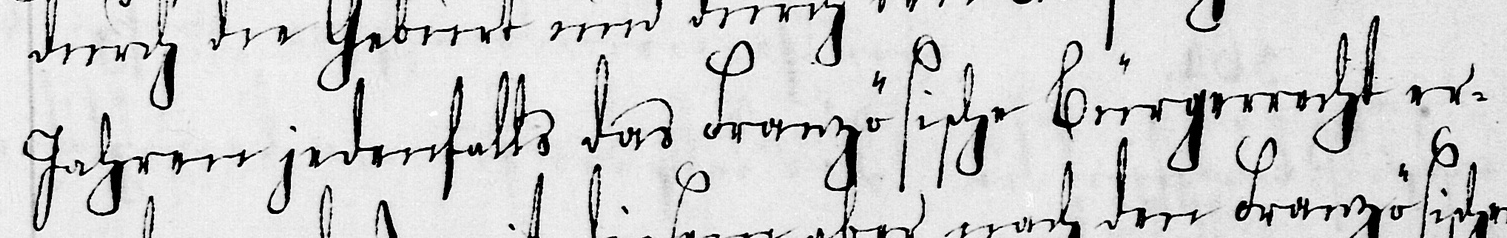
Jahren jedenfalls das Französische Bürgerrecht er¬
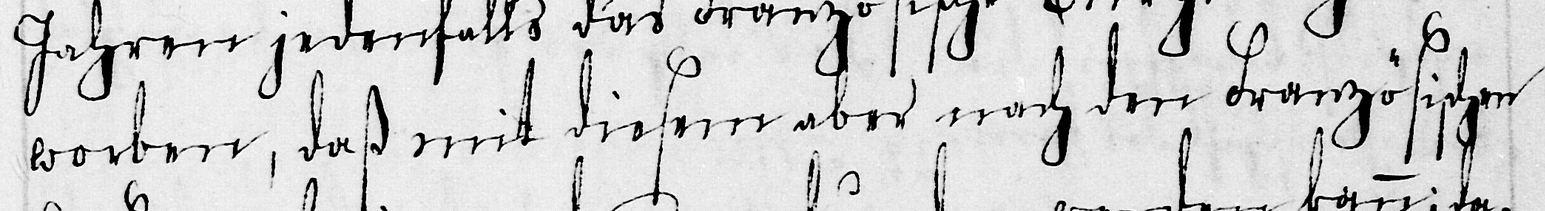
worben, daß mit diesem aber nach den Französischen
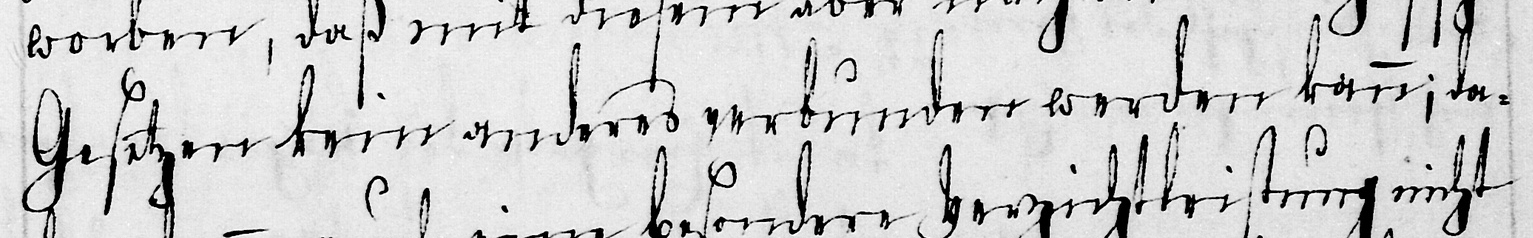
Gesetzen kein anderes verbunden werden kann; da¬
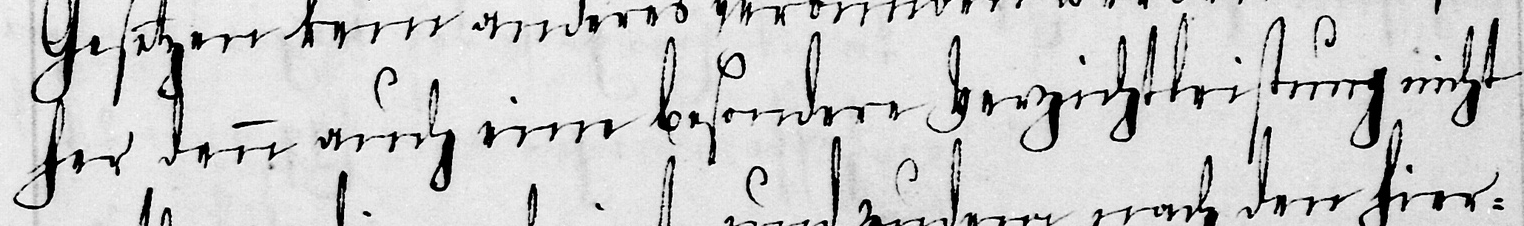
her denn auch eine besondere Verzichtleistung nicht
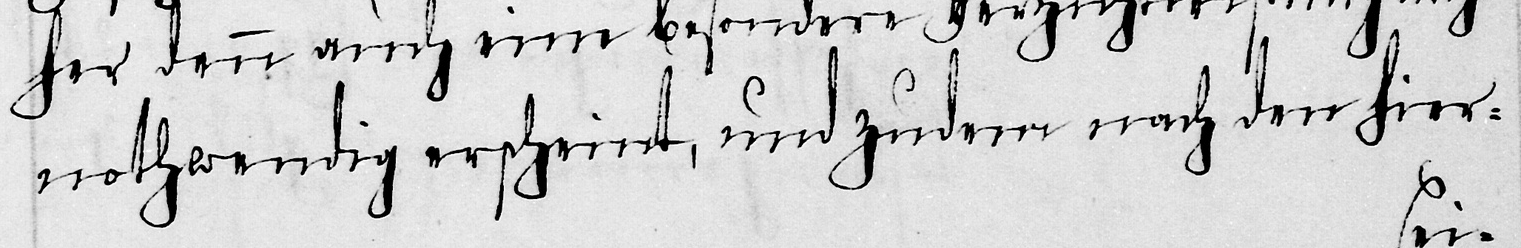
nothwendig erscheint, und zudem nach den hier-
